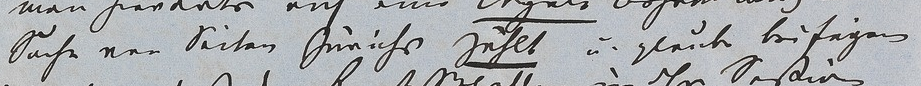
Sache von Seiten Zürichszählt u. glaube beifügen
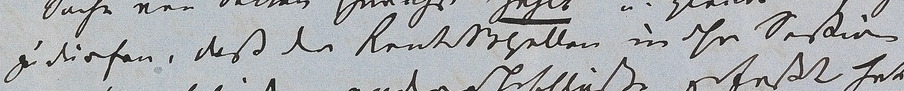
zu dürfen, daß der Kant St Gallen in dsr Seßion
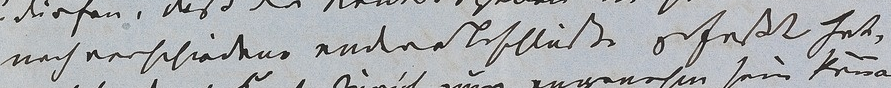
noch verschiedene andre Beschlüße gefaßt hat,
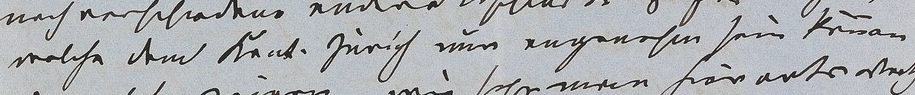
welche dem Kant. Zürich nur angenehm sein können
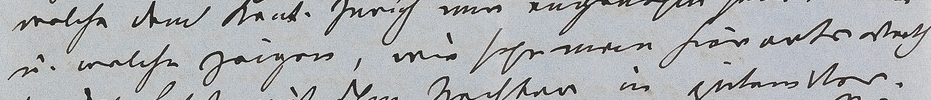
u. welche zeigen, wie sehr man hierorts werth
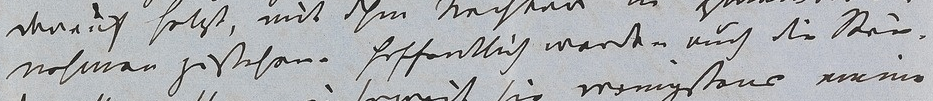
nehmen zu stehen. Hoffentlich werden auch die Stän-
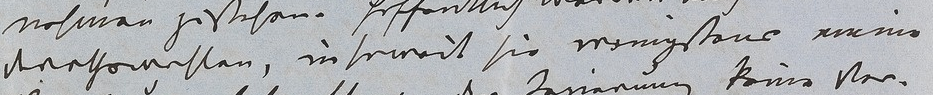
derathswahlen, insoweit sie wenigstens meine
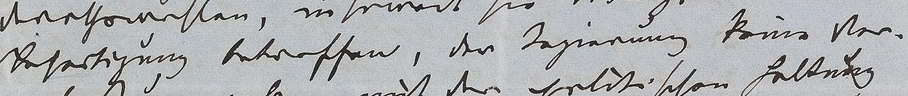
Beseitigung betreffen, der Regierung keine Ver-
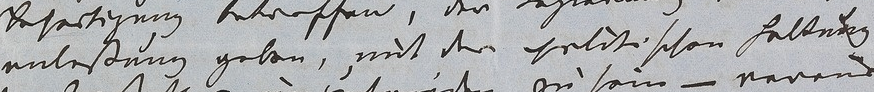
anlaßung geben, mit der politischen Haltung
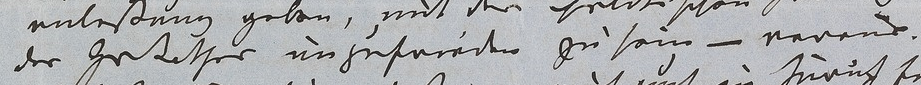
des Gr Rathes unzufrieden zu sein – voraus-
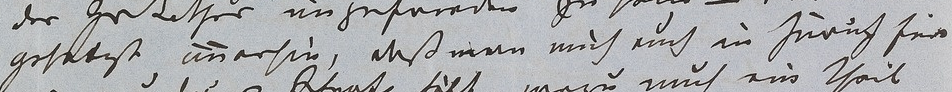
gesetzt immerhin, daß man mich auch in Zürich für
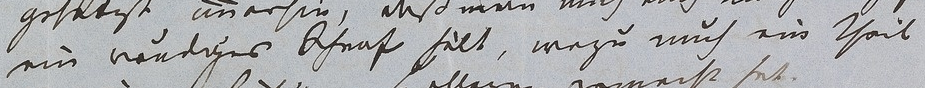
ein räudiges Schaaf hält, wozu mich ein Theil
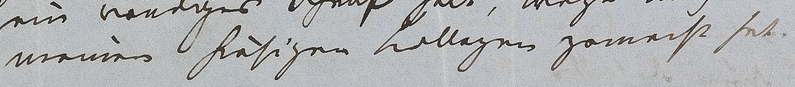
meiner hiesigen Collegen gemacht hat.
